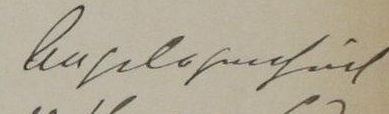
Angelegenheit
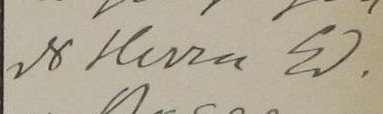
des Herrn Ed.
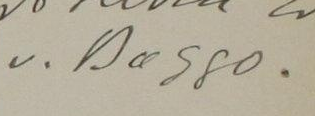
v. Baggo.
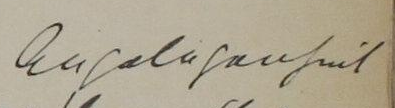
Angelegenheit
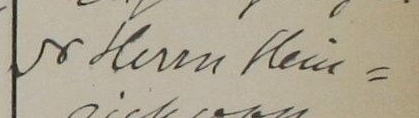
des Herrn Hein-
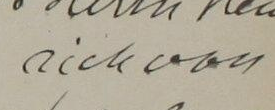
rich von
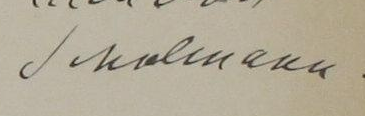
Schulmann
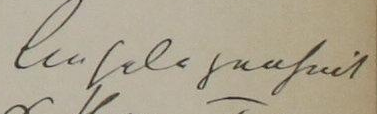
Angelegenheit
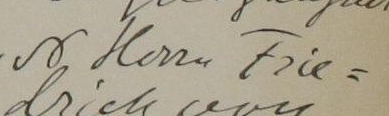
des Herrn Frie-
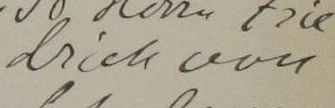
drich von
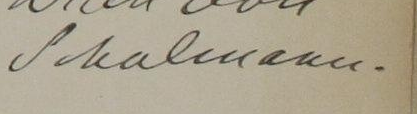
Schulmann.
